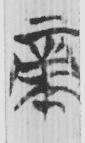帝
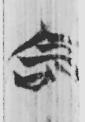命
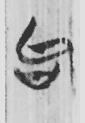句
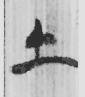土
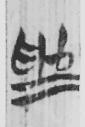爲
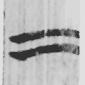二
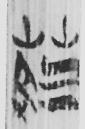{艹阝仌}（陵）
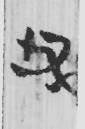屯
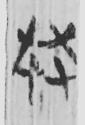共
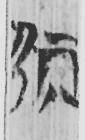凥
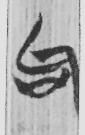句
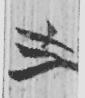之
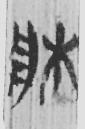牀
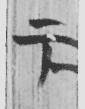下
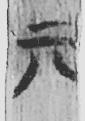亓
